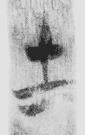十二
